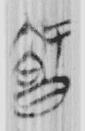智
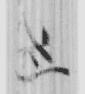之
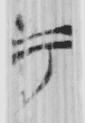于
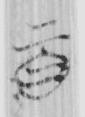百
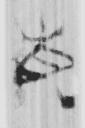眚
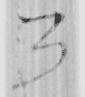乃
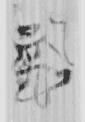{血卩心}
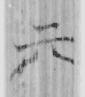亓
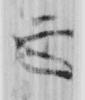正
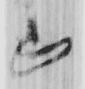㠯（以）
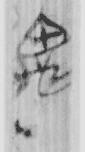禺
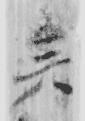亓
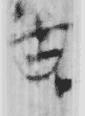古
